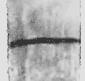一
